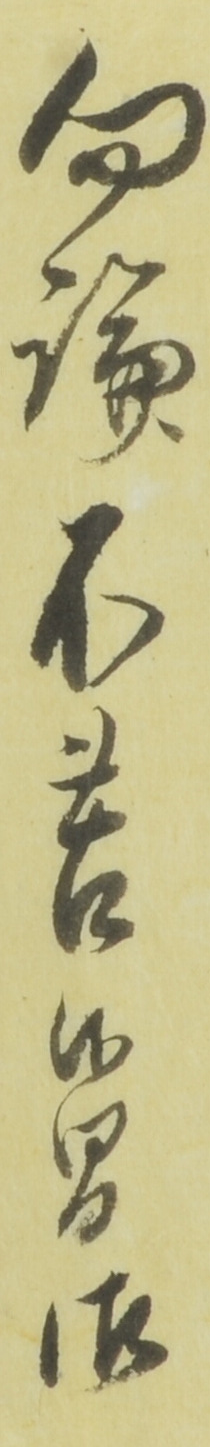勿論不苦候間御
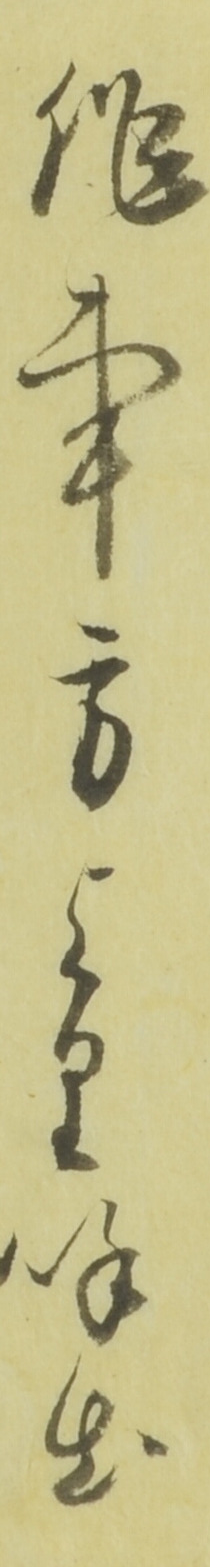作事方より呼出
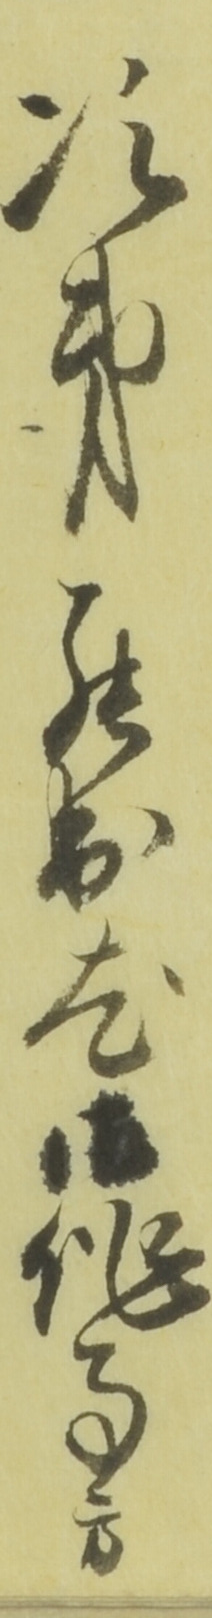次第罷出尤御作事方
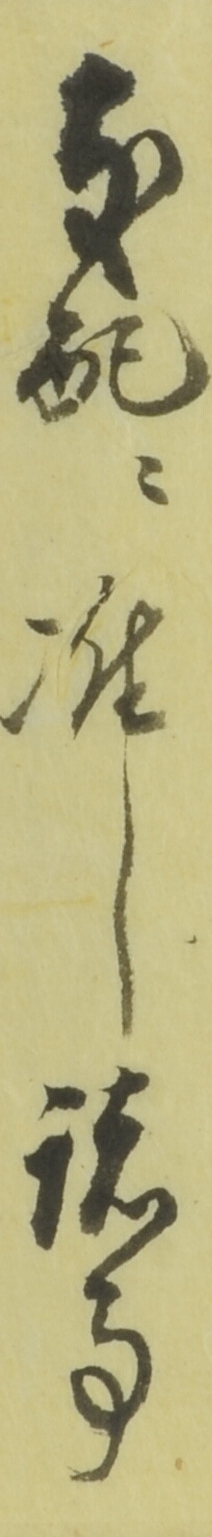支配ニ准し諸事
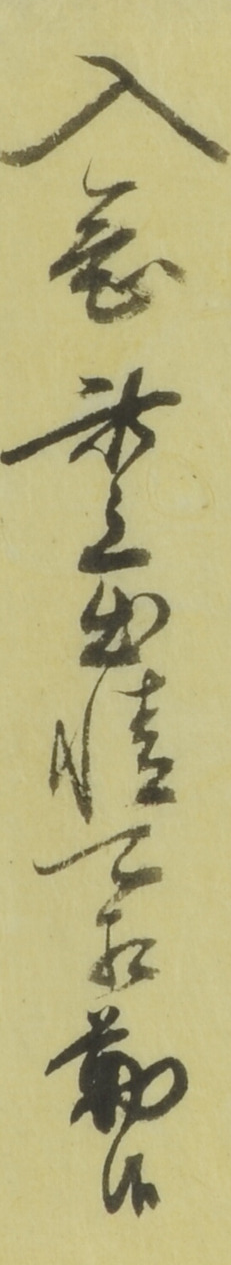入念此上出精可相勤候
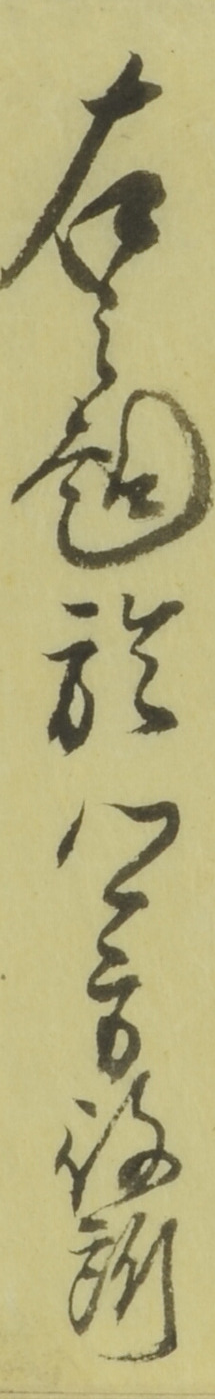右之趣於郷方役所
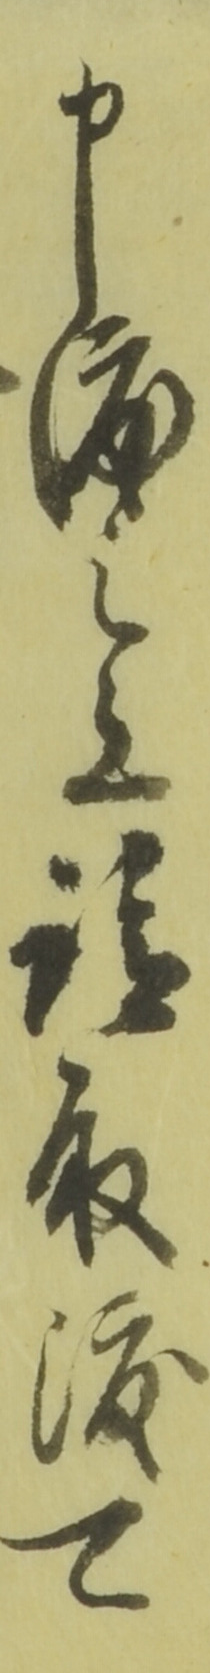申渡之上請取渡可
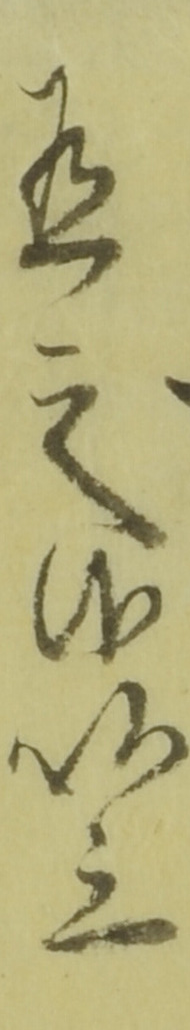有之候以上
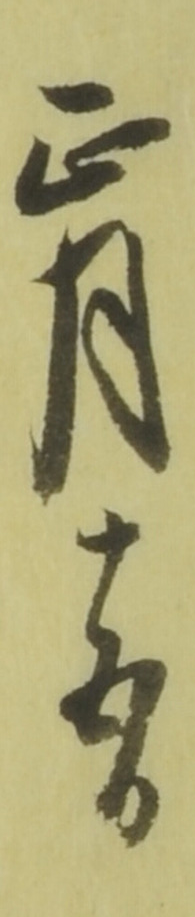正月十五日

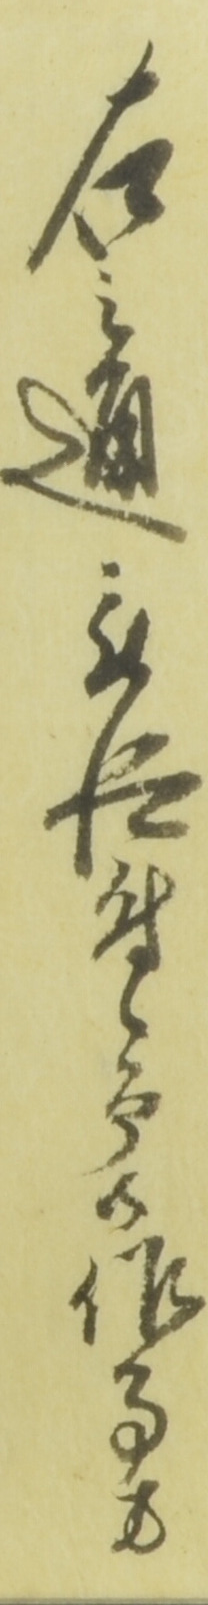右之通被仰付候而御作事方
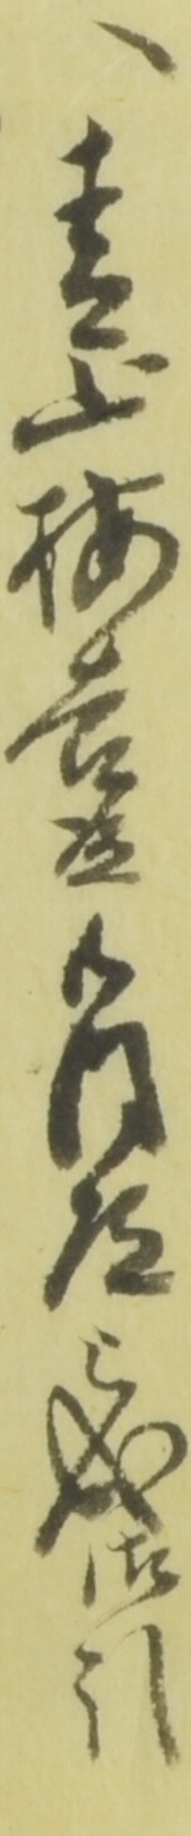へ青山梅吉殿御同道被成御引
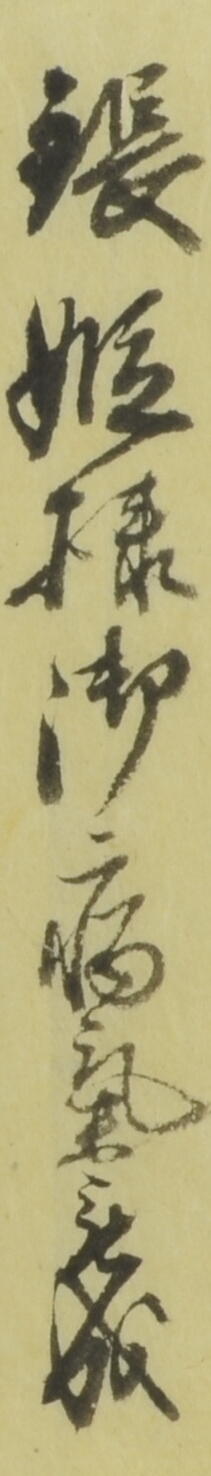鋹姫様御病気被成
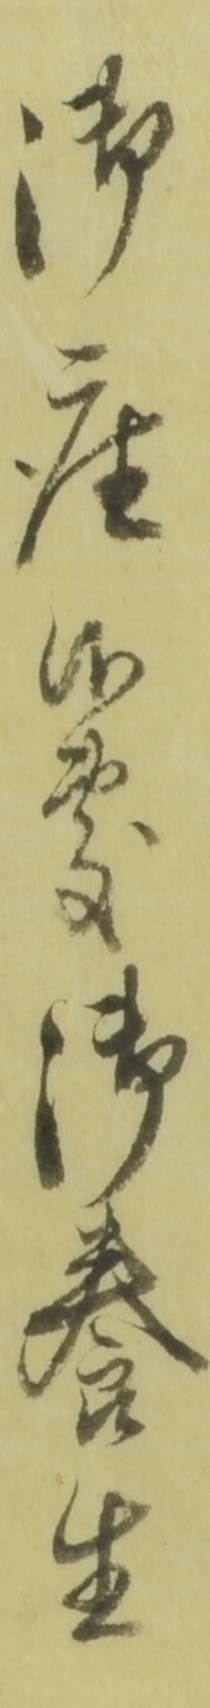御座候処御養生
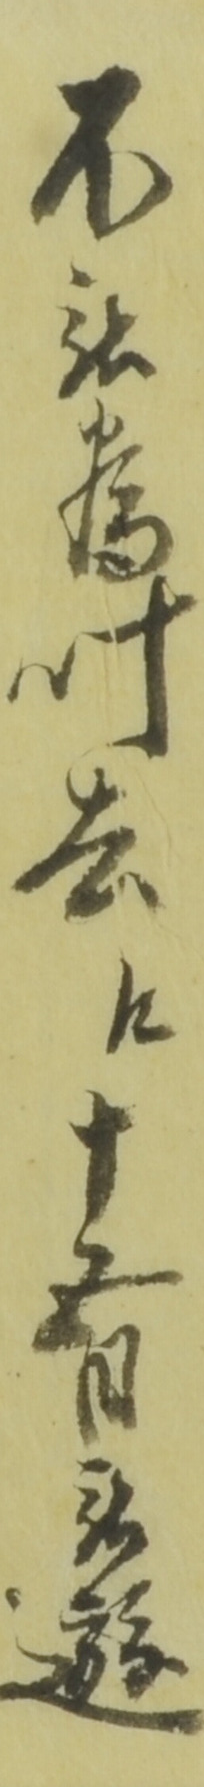不被為叶去ル十五日被遊
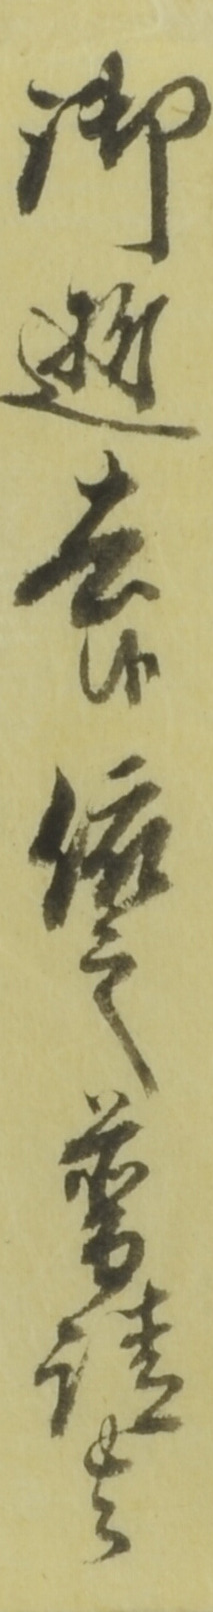御逝去候依之普請は
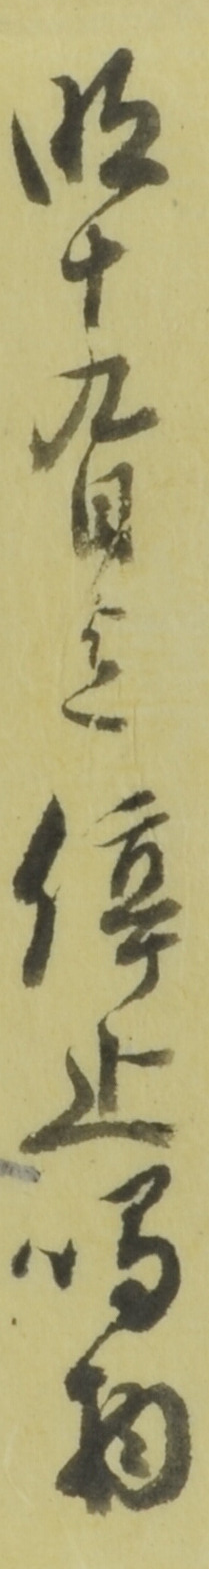明十九日迄停止鳴物
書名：御触書御書附控
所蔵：伊那市立高遠町図書館・合同会社AMANE
